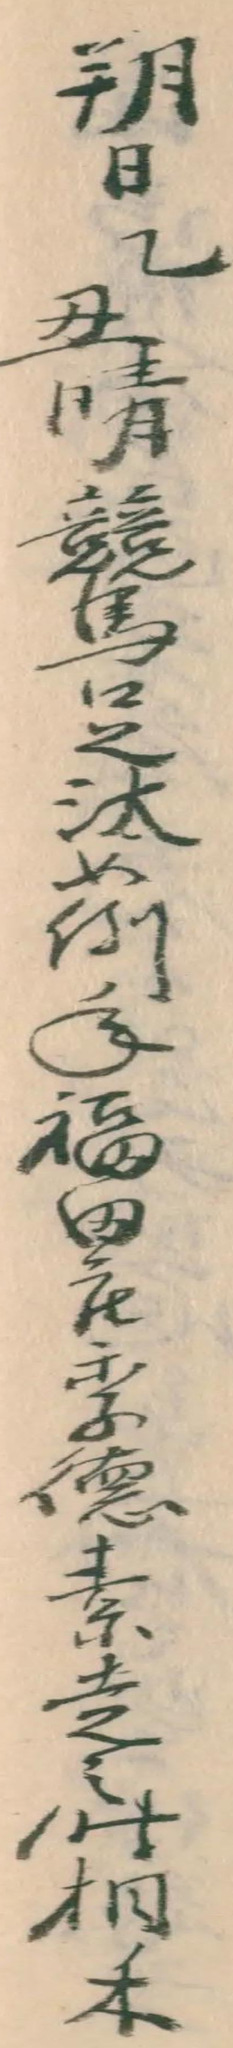朔日乙丑晴競馬足汰如例年福田庄季徳素走之時相ノ木
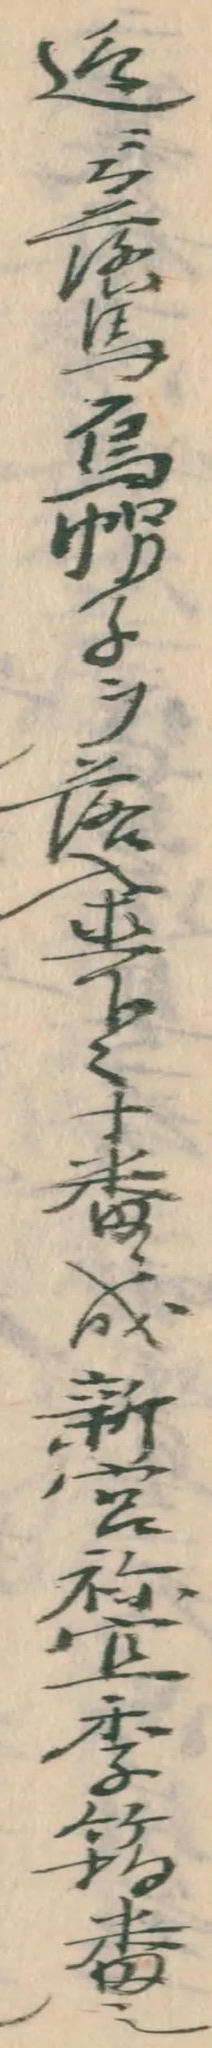邊ニ而落馬烏帽子ヲ落入直下也十番ニ成新宮称宜季筠番之
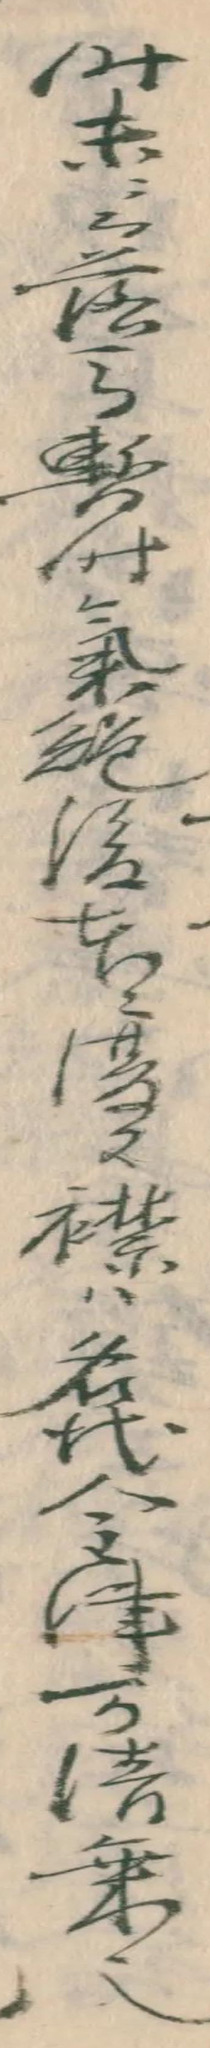時末ニ而落馬暫時気絶後本ニ復す襟ハ名代金津可清乗也
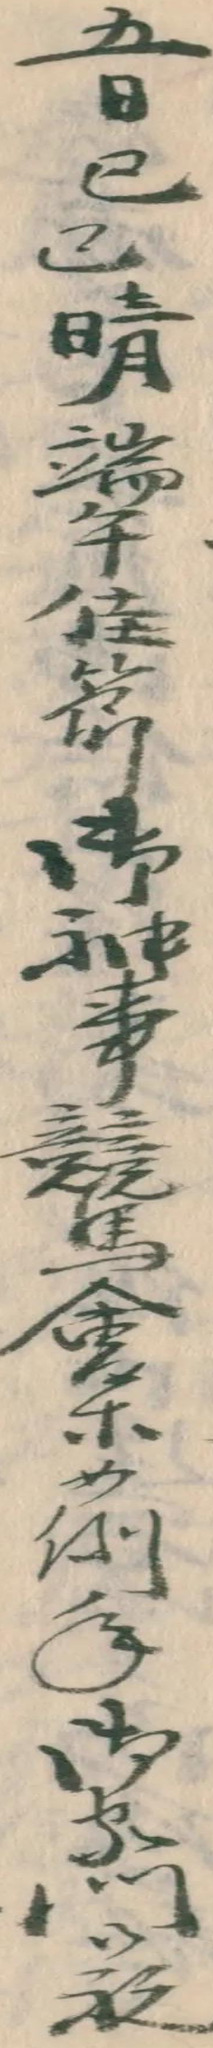五日己巳時端午佳節御神事競馬會等如例年御家門御祝
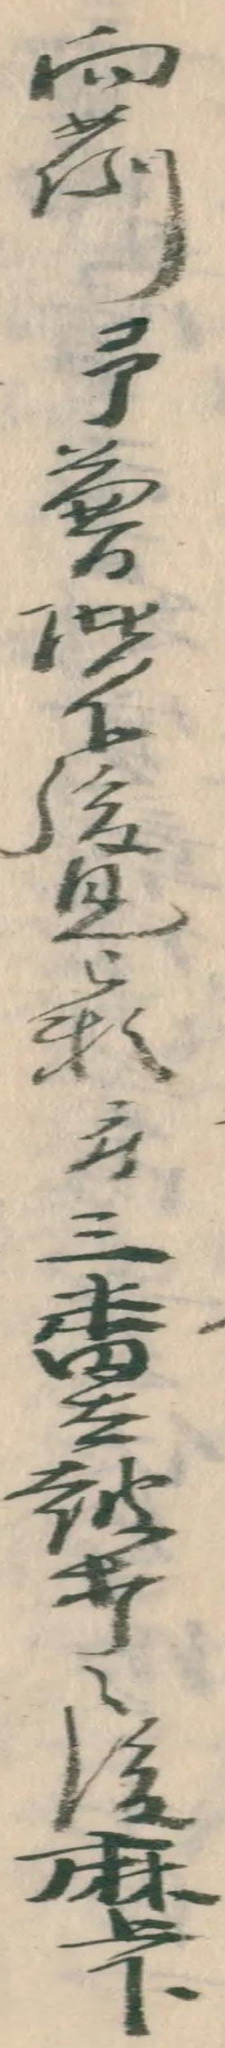向如例予兼而階下後見被頼ニ付三番太皷打之後麻上下
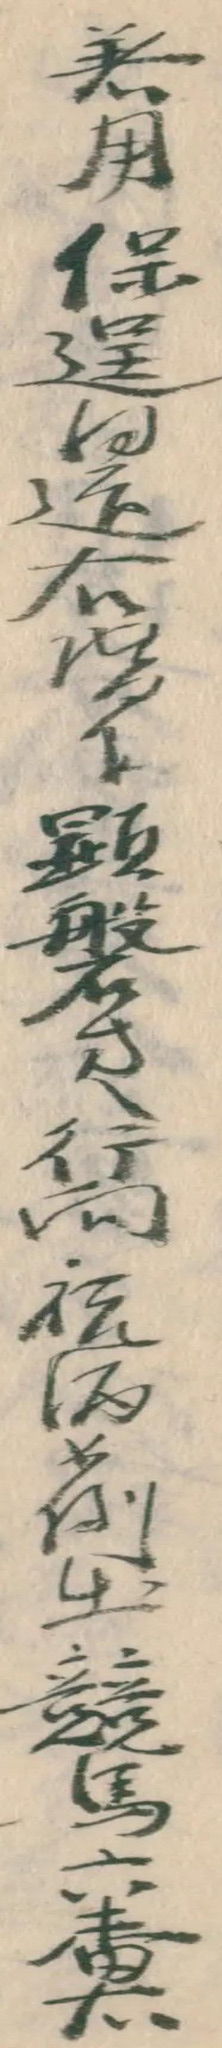着用保逞同返右階下顕般右方へ行向祝酒如例出競馬六番右
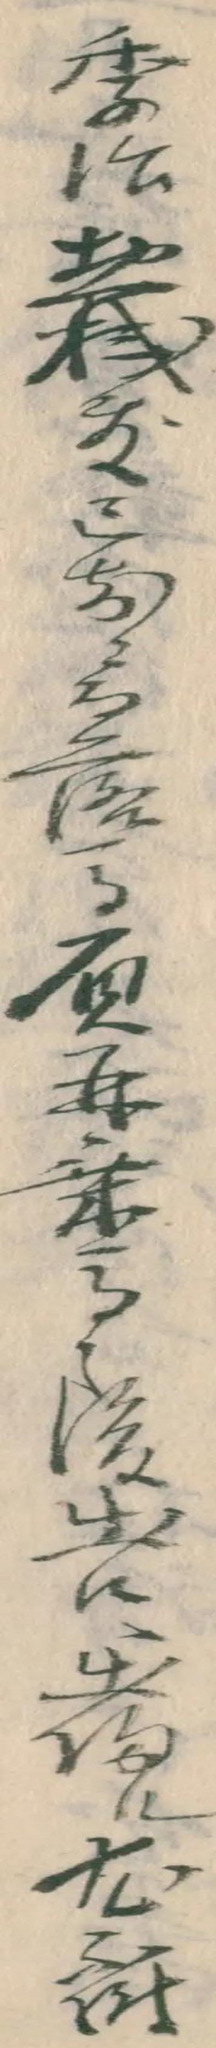季治惣桟敷已前二而落馬負并乗馬之後出候へ出帰ル尤不附
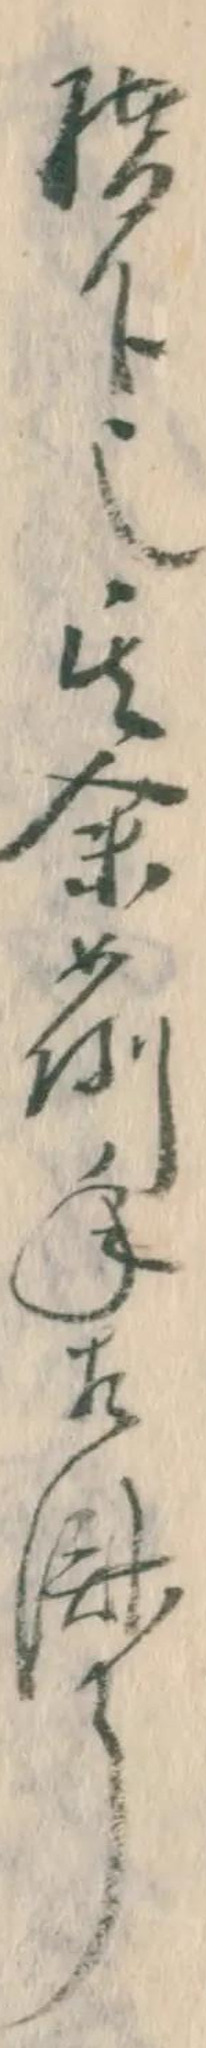階下也其余如例年相済了
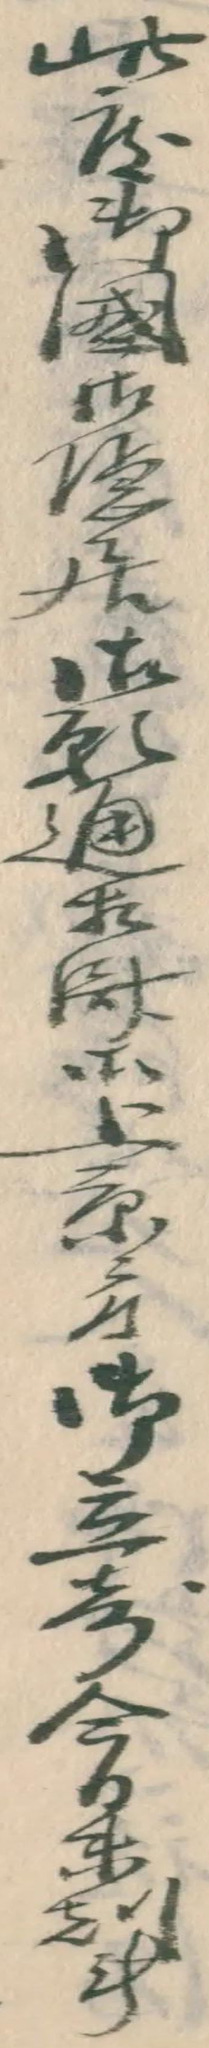此度御國御隠居御願通相済御上京ニ付御立寄今日未刻斗
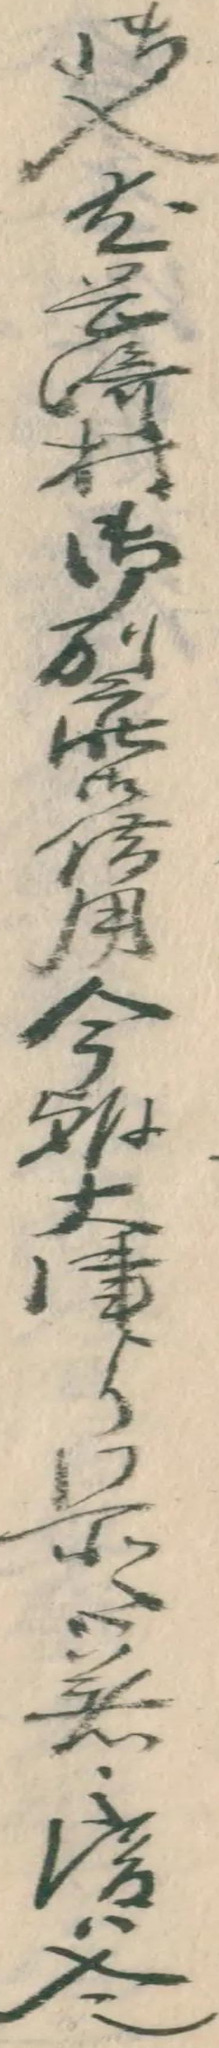御入尤岡崎村御別荘御借用今朝大津より同所へ御着之後は入也
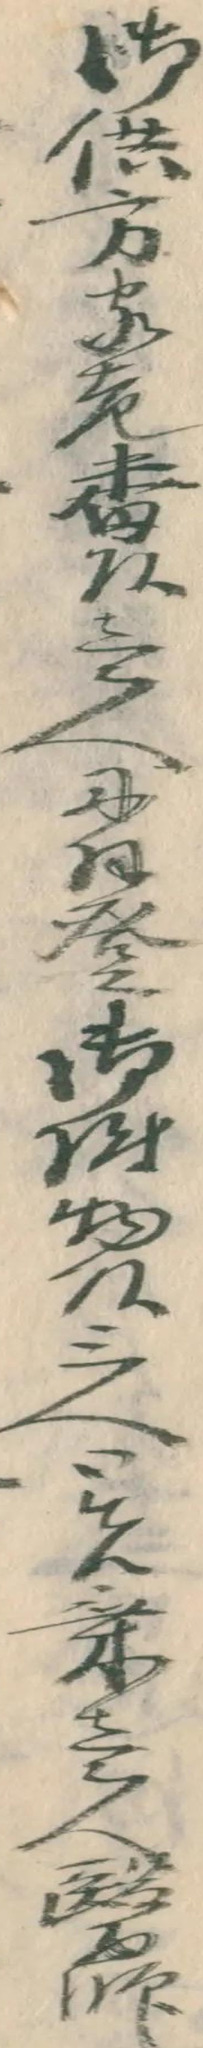御供方家老番頭壱人丹羽登御附物頭三人御先乗壱人醫師
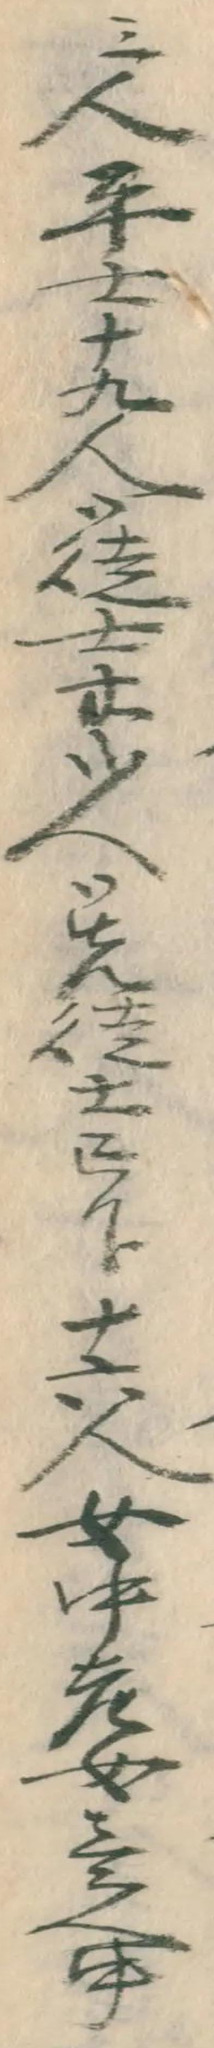三人平士十九人御徒士廿弐人御先徒士已下十六人女中老女壱人申

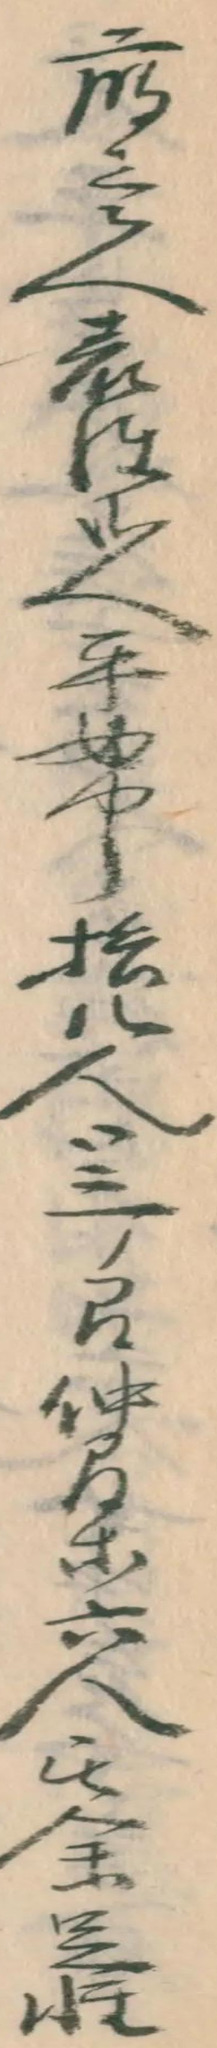臈壱人表役弐人平女中拾八人御三の間仲間等六人其余足軽
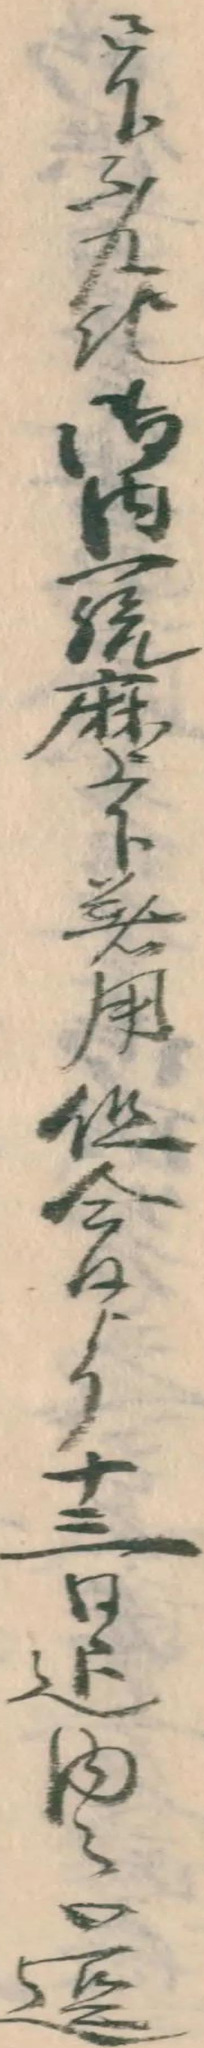已下不及記御内一統麻上下着用但今日より十三日迄内々御逗
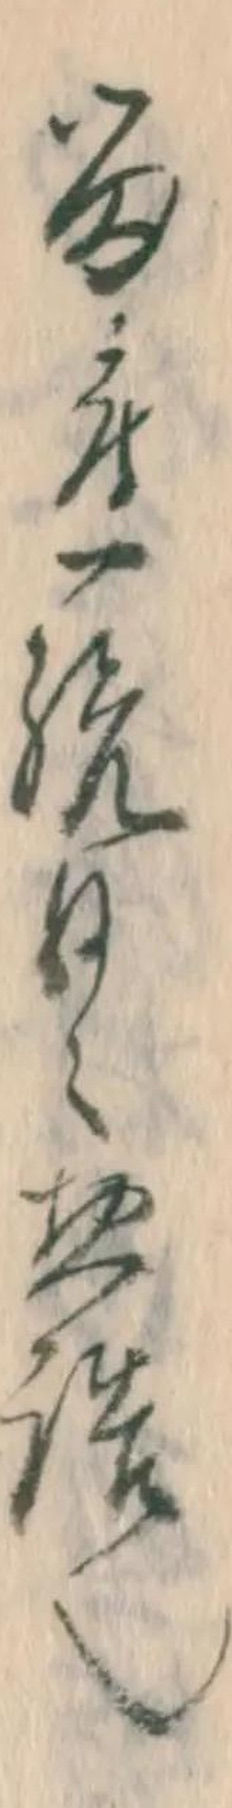留ニ付一統日々惣詰也
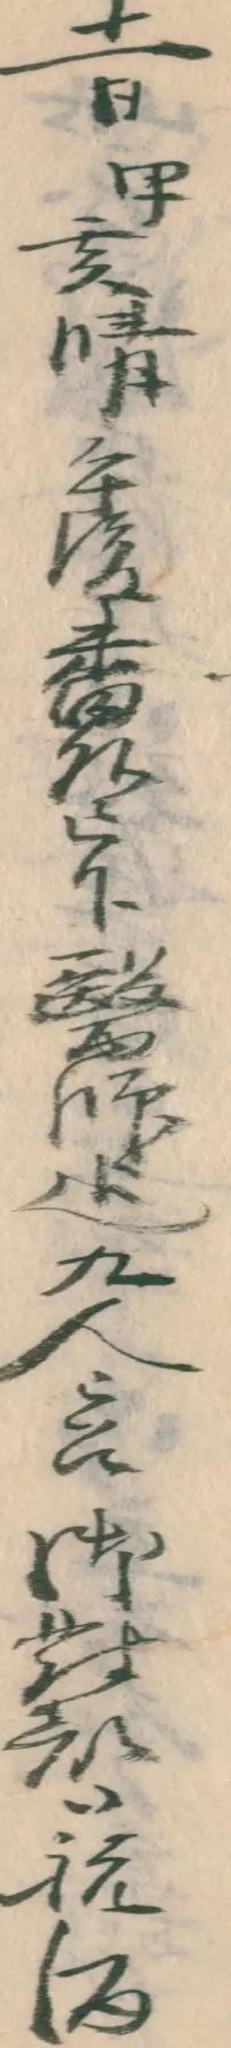十一日甲亥晴午後番頭已下醫師迄九人被召御對顔御祝酒
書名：賀茂社記録. 第66冊
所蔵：国立国会図書館 National Diet Library, JAPAN
